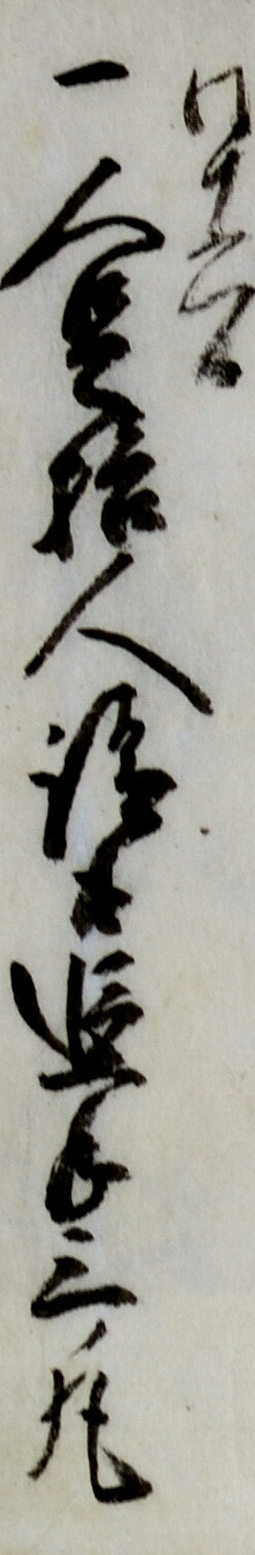一人足拾人請取追手三ノ丸
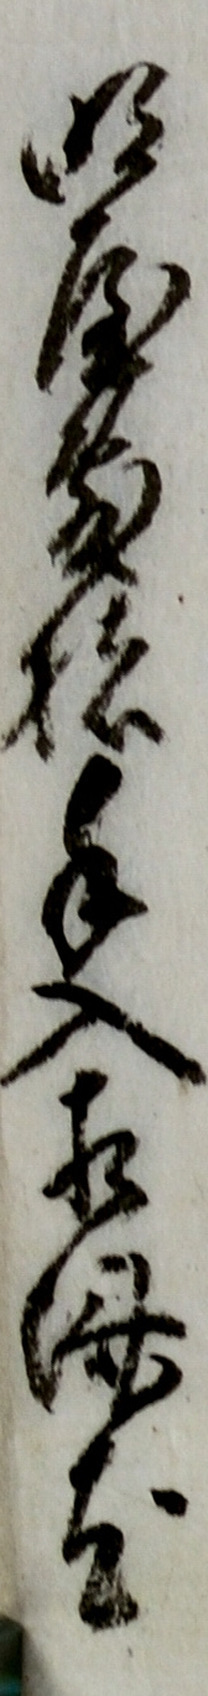明屋敷楮手入相済尤

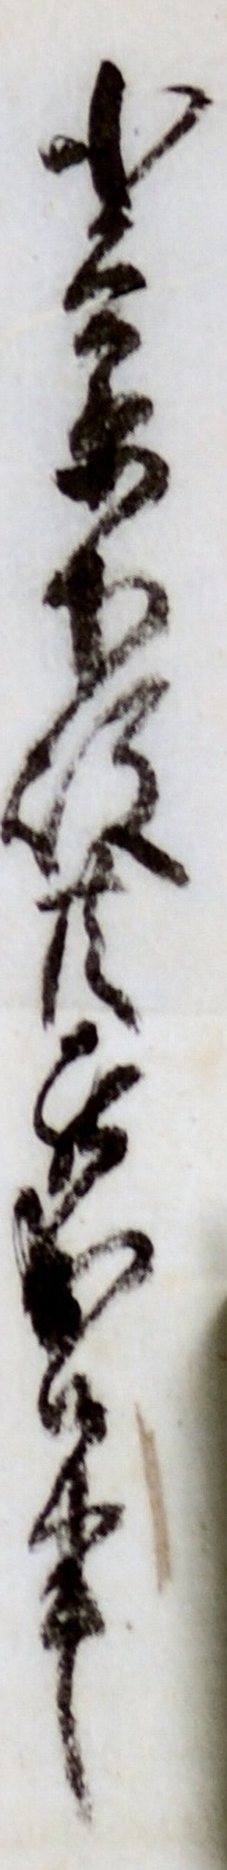小兵衛下役共罷出候事
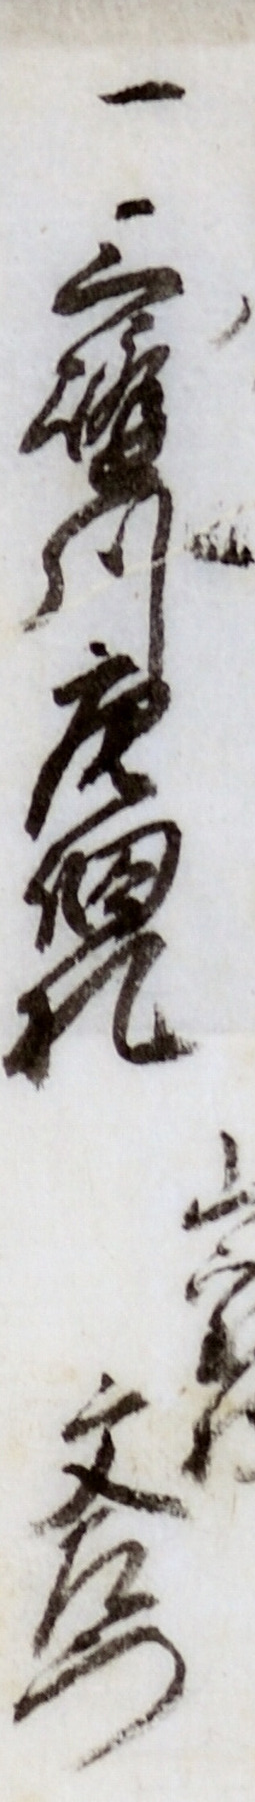一三峰川唐網札文左衛門
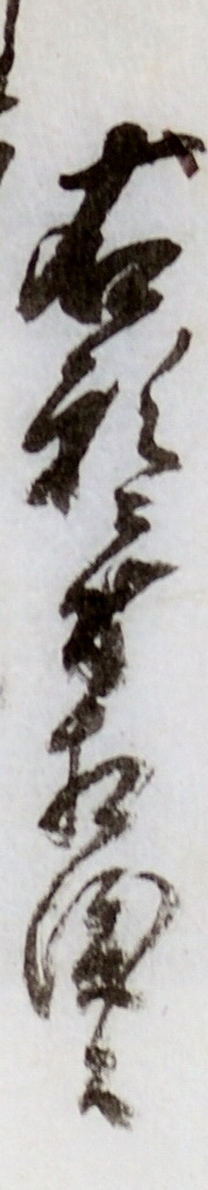右願に付相渡候
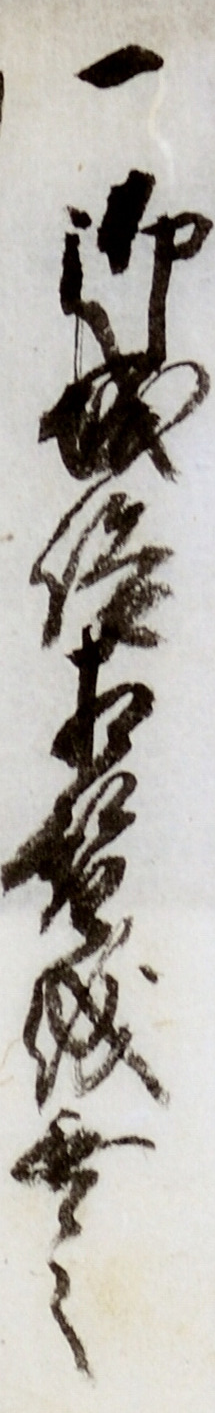一御城詰相替儀無之
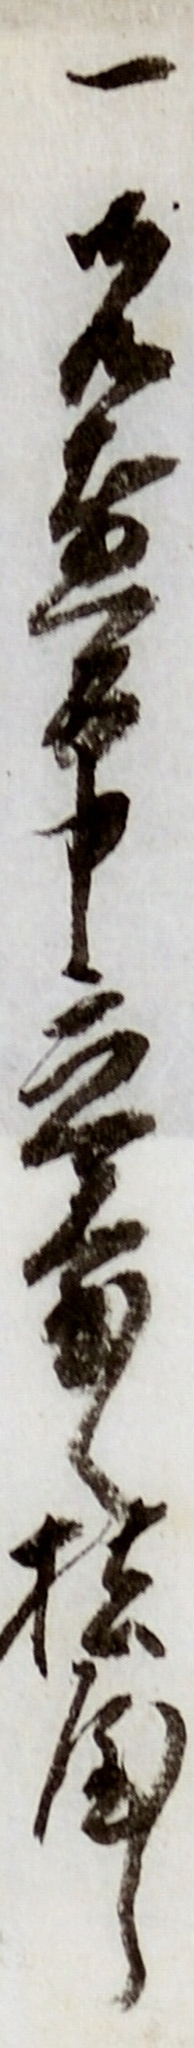一先達而申立置候楮やし
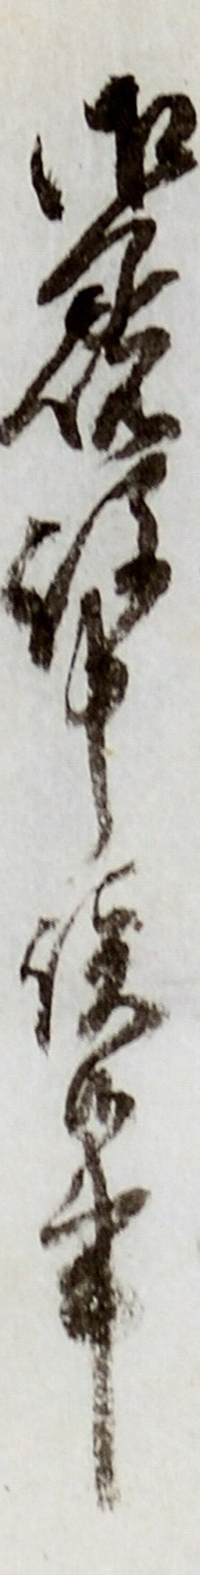御厩役申談候事
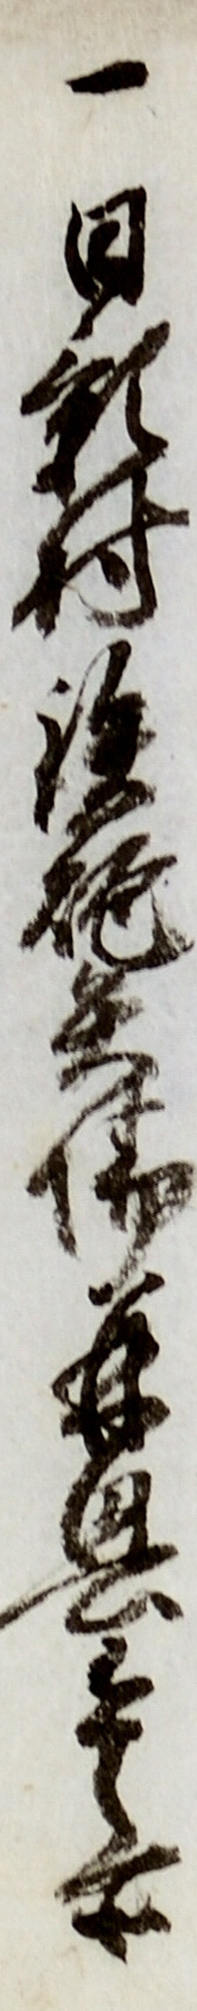一日影村鉄砲矢場并岡阜之所
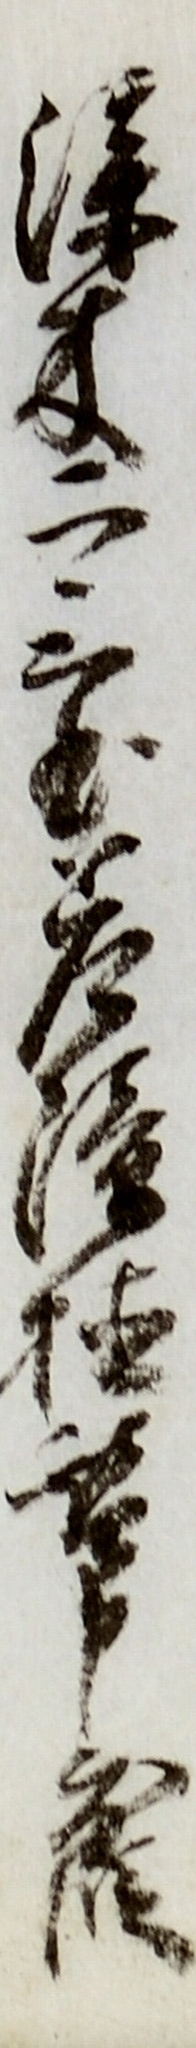漆木二三本差障植替申度段
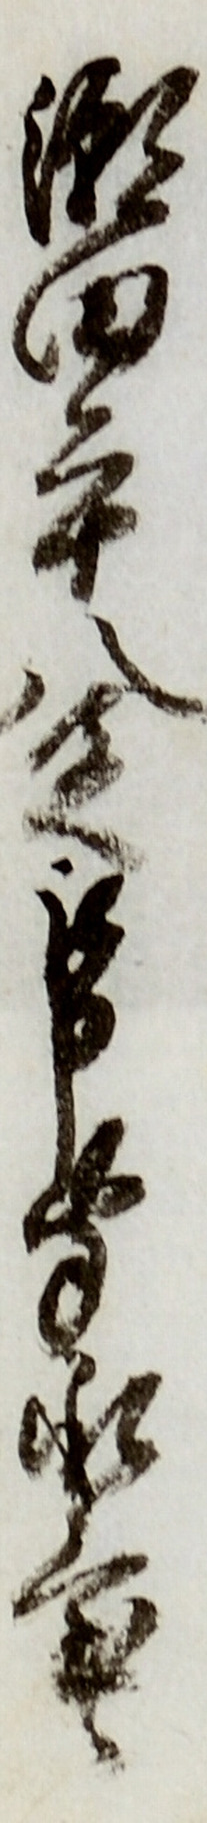潮田平八殿被申聞承置候
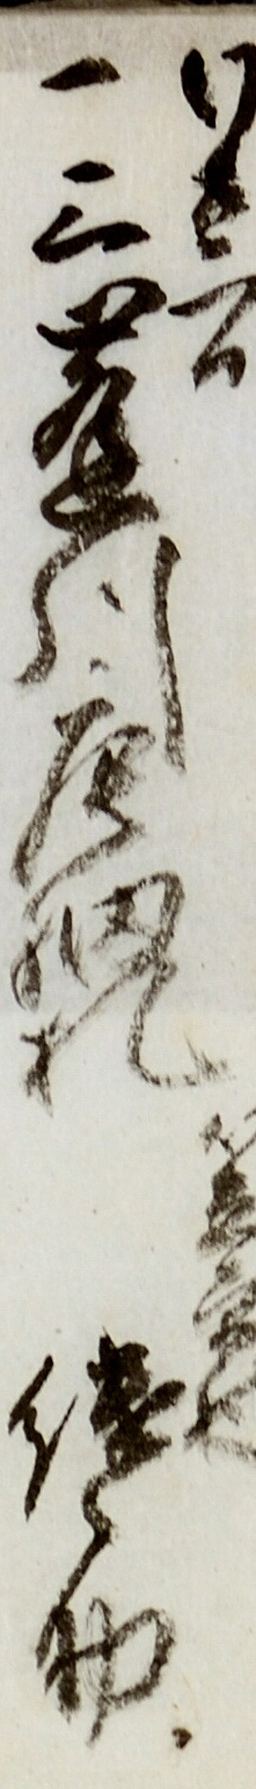一三峰川唐網札継之助
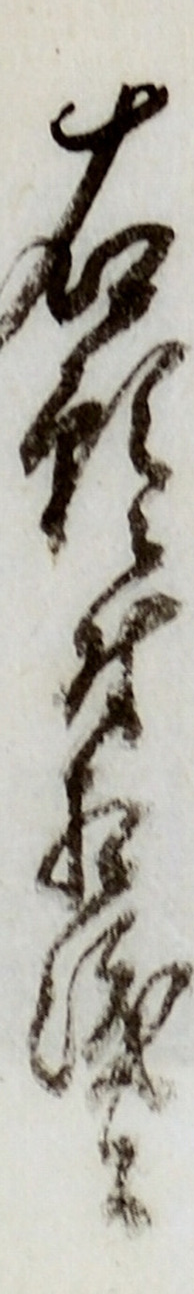右願に付相渡候
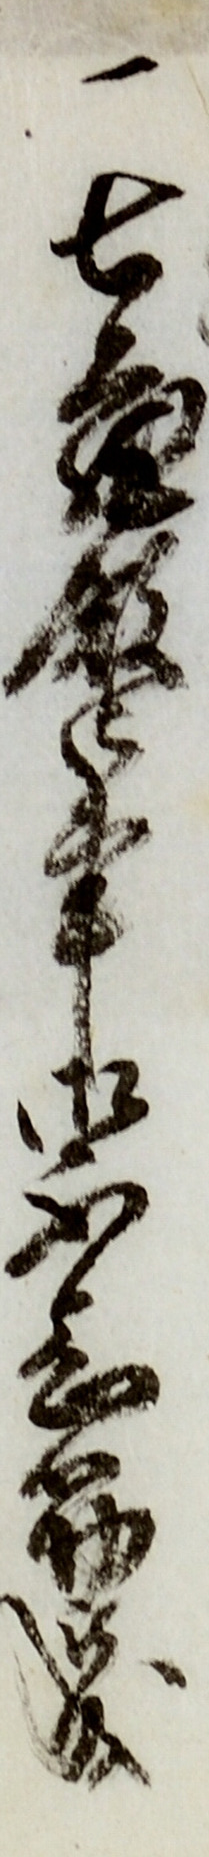一七蔵殿御事御不念筋被成
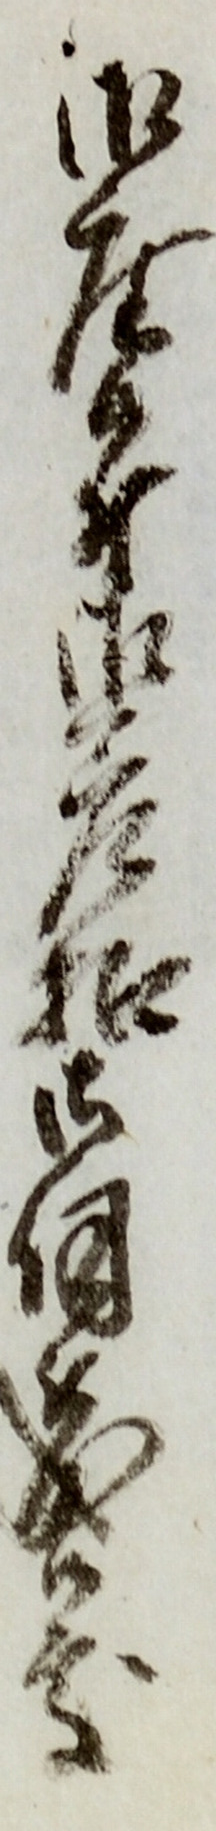御座候付御差扣御伺被成候処
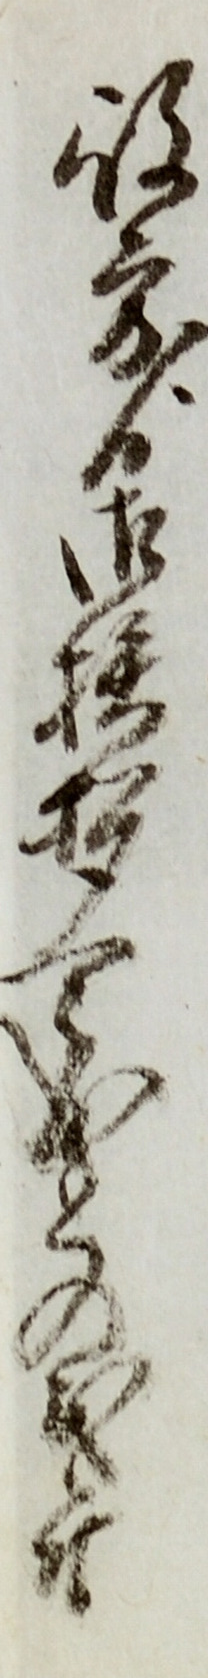役方より御挨拶可被成との義候付
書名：諸事御用留帳
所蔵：伊那市立高遠町図書館・合同会社AMANE
